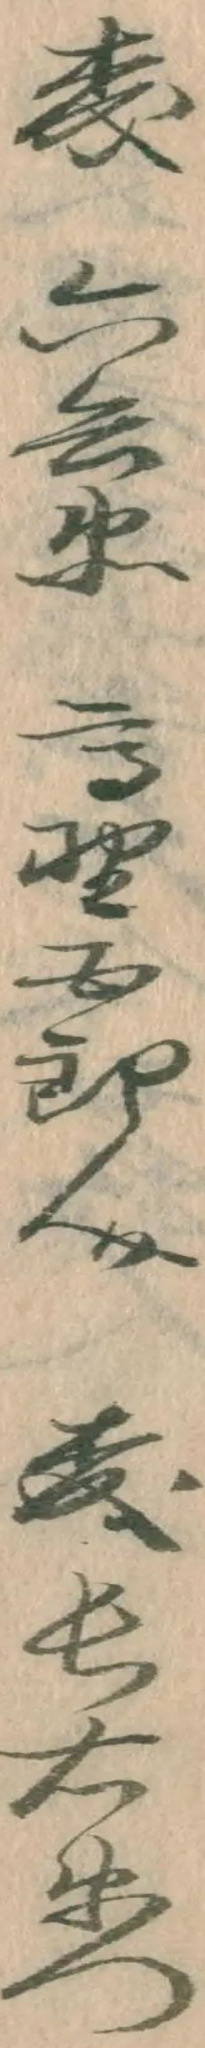森六兵衛高野五郎介森長右衛門
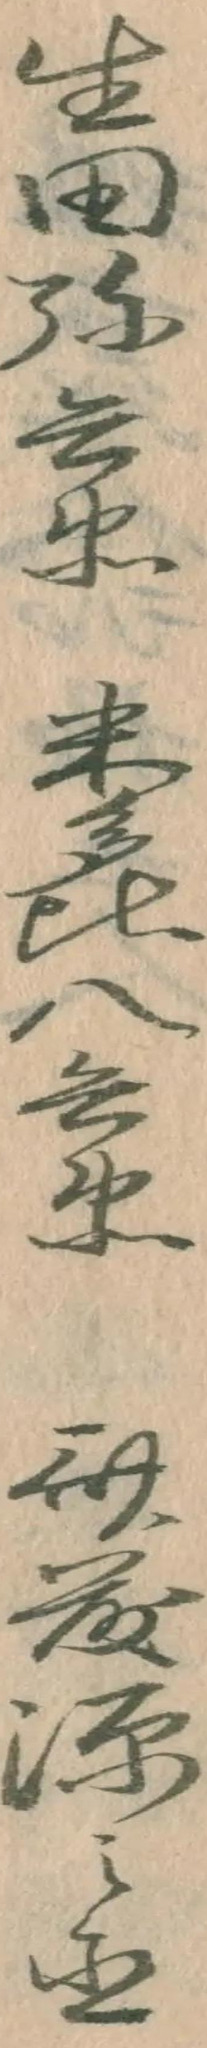生田弥兵衛末多比八兵衛斎藤源之丞
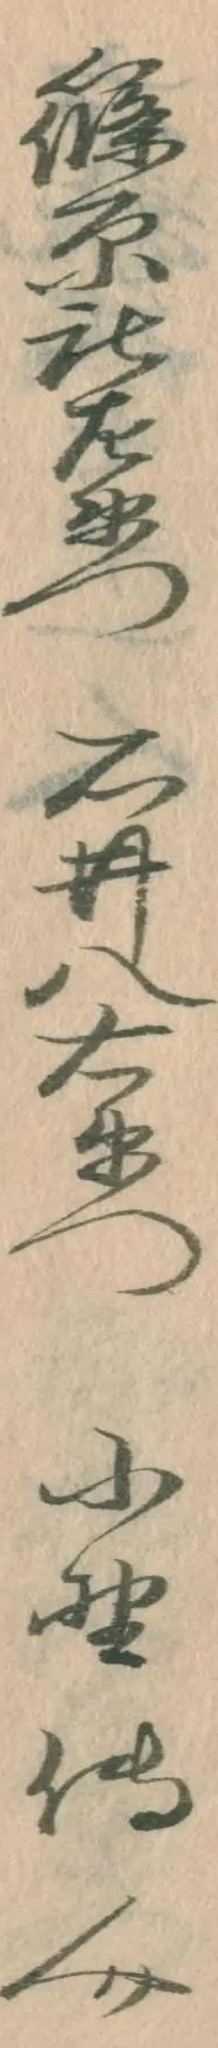篠原庄左衛門石井八右衛門小野伝介
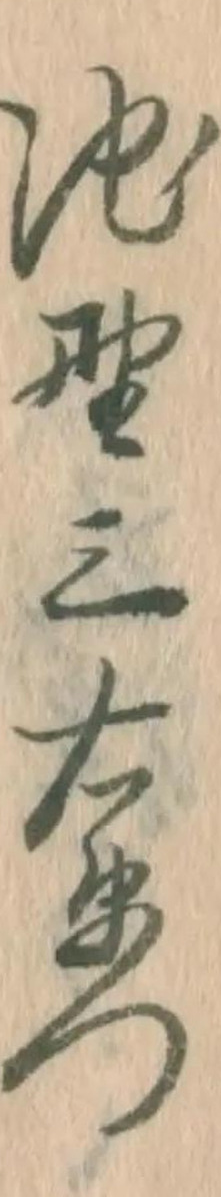池野三右衛門
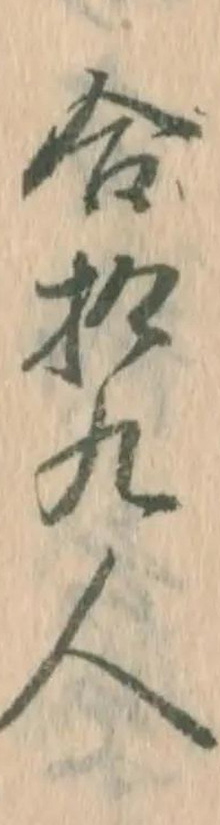合拾九人
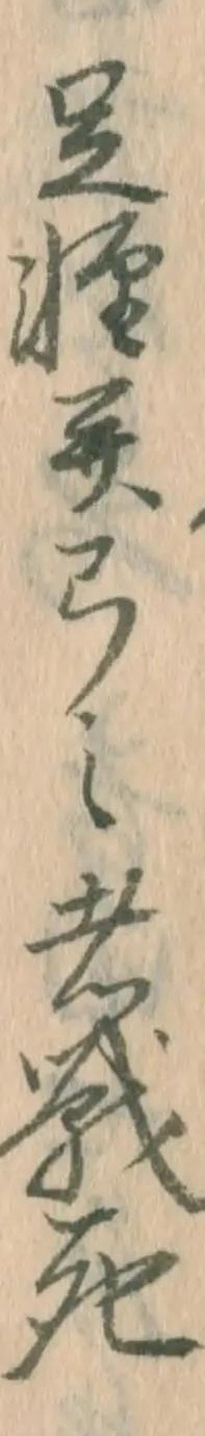足軽幷弓之者戦死

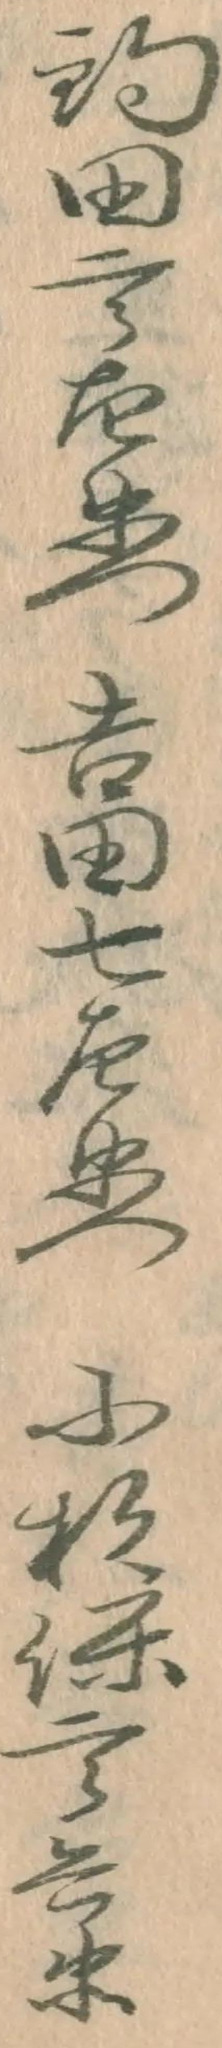釣田二郎左衛門吉田七左衛門小杉保二郎兵衛
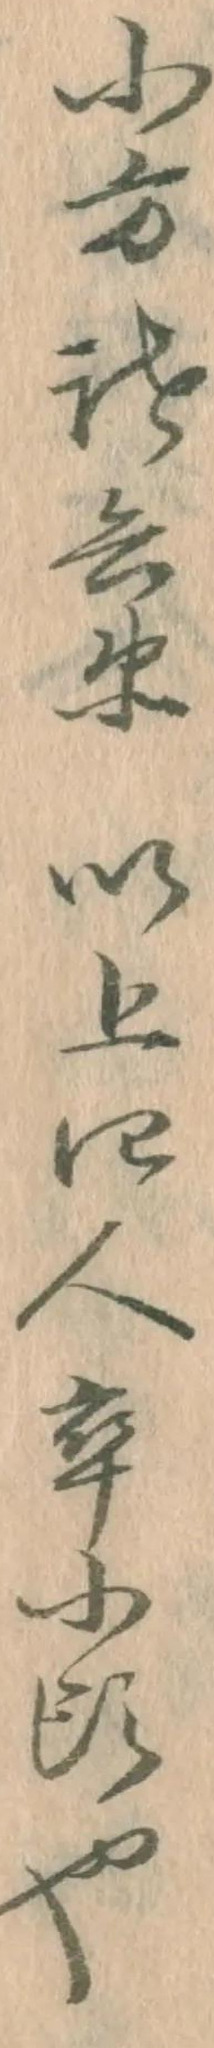小方諸兵衛以上四人卒小頭也
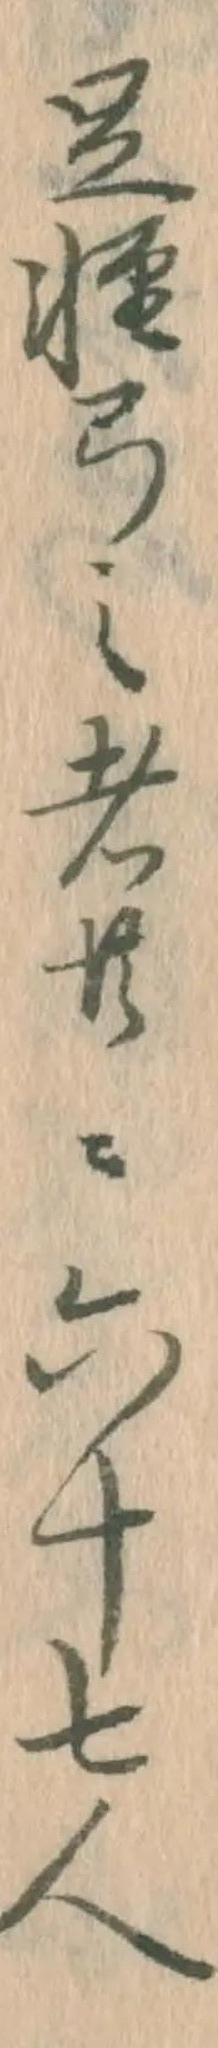足軽弓之者共に六十七人
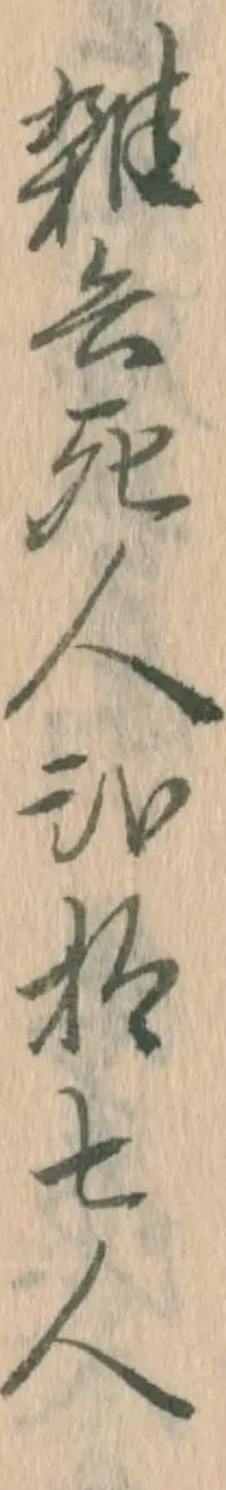雑兵死人弐拾七人
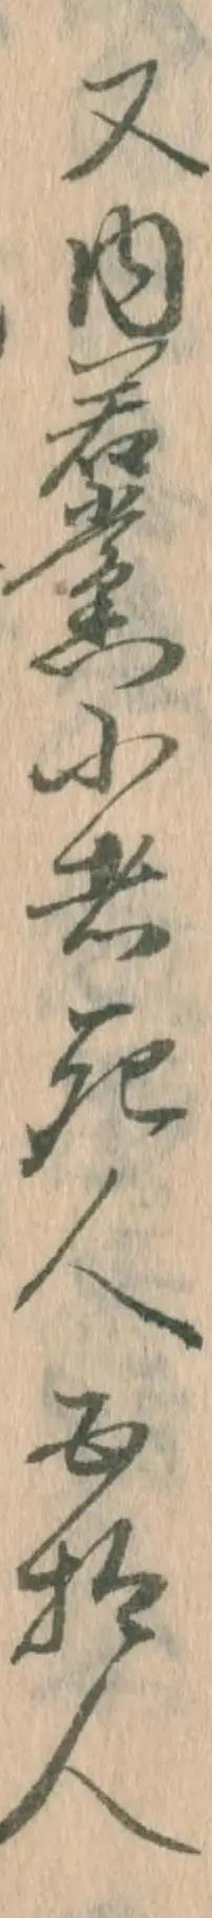又内若党小者死人五拾人
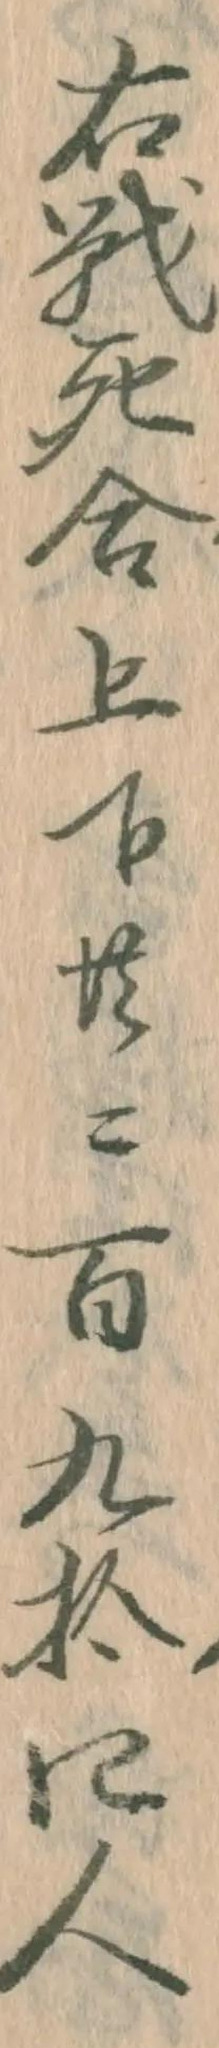右戦死合上下共に百九拾四人
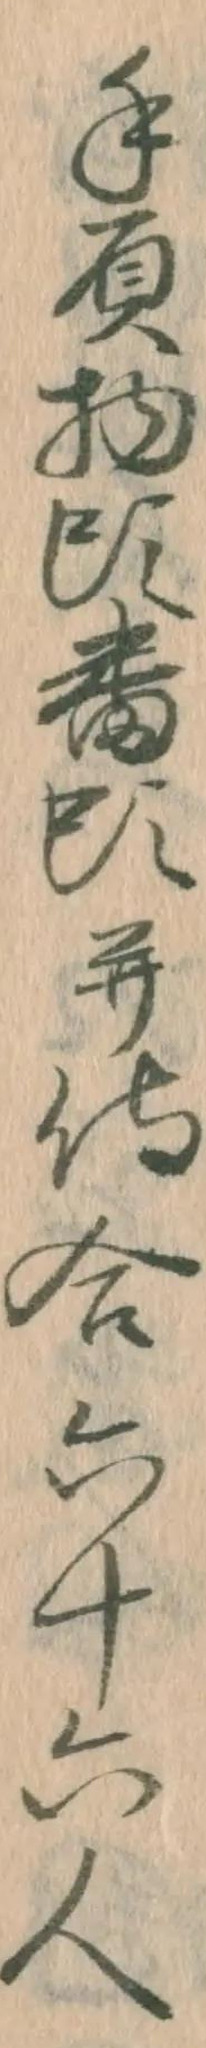手負物頭番頭幷侍合六十六人
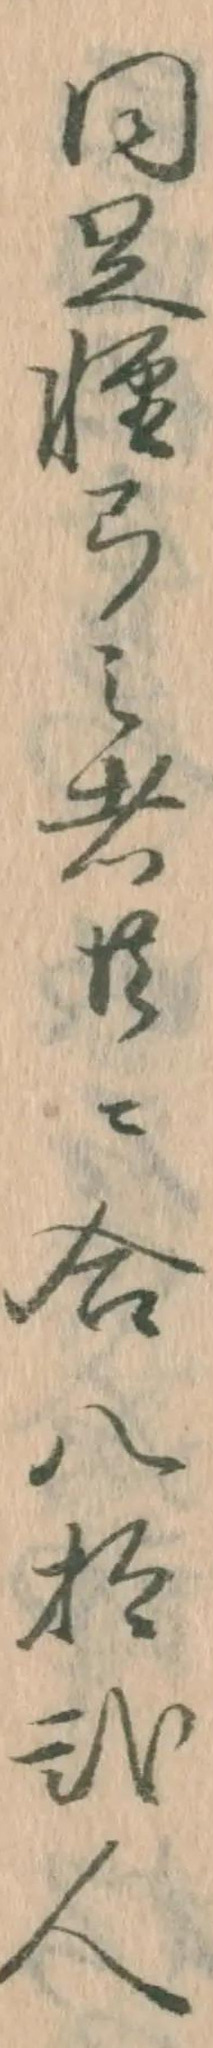同足軽弓之者共に合八拾弐人
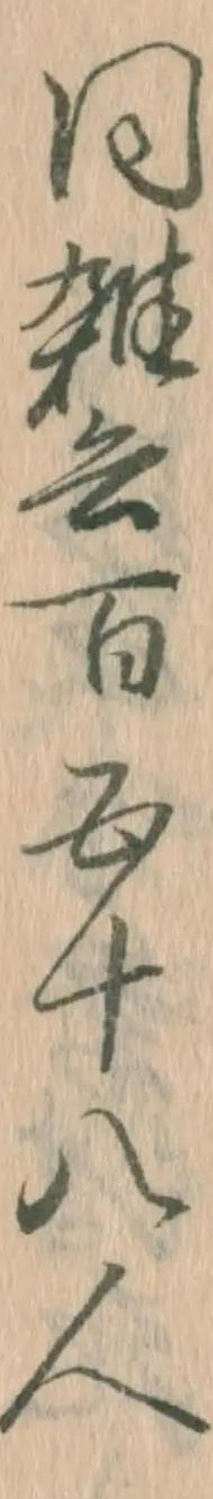同雑兵百五十八人
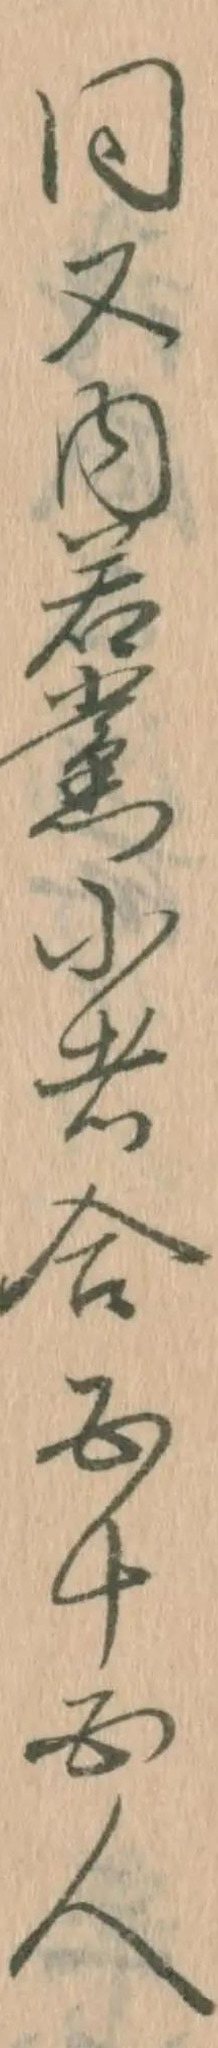同又内若党小者合五十五人
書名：切支丹御退治記 49巻. [9]
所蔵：国立国会図書館 National Diet Library, JAPAN
